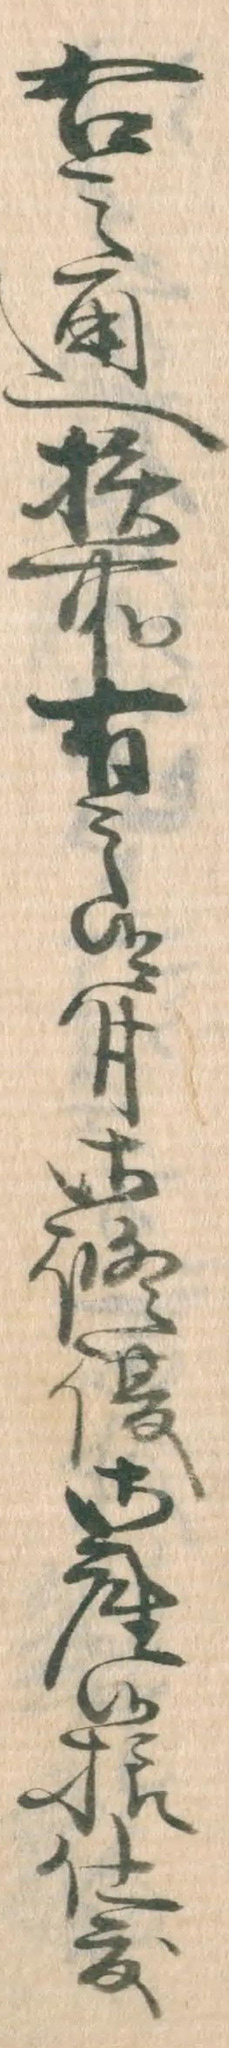右之通損所有候ニ付御修復御座候様仕度
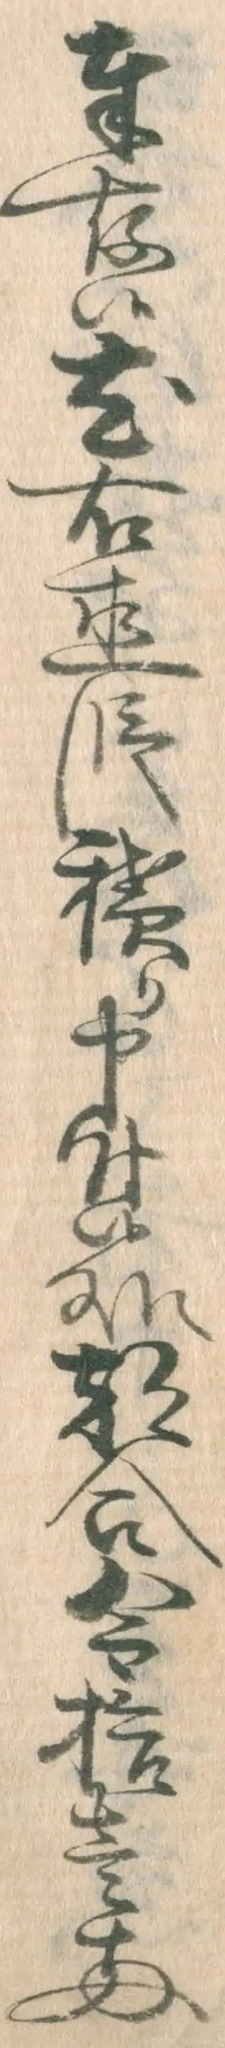奉存候尤右直段積り申付候処都合金拾壱両

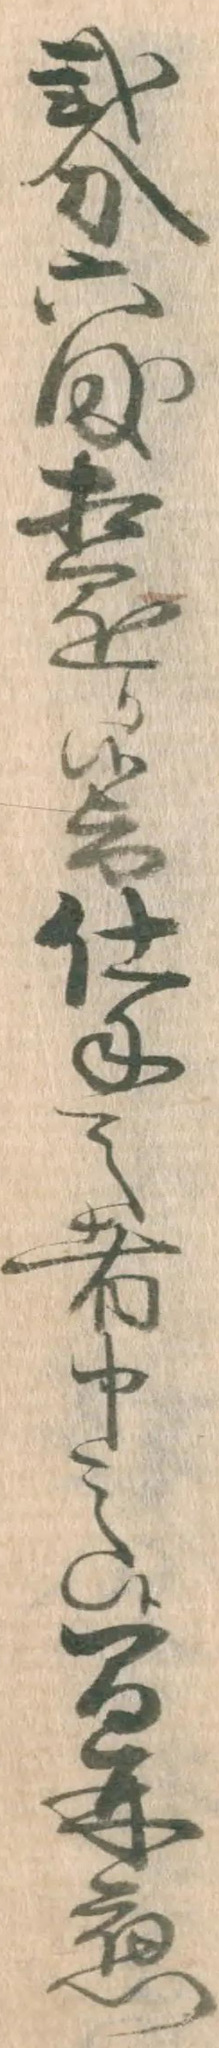弐分六匁相懸り候旨仕手之物申之候間再応
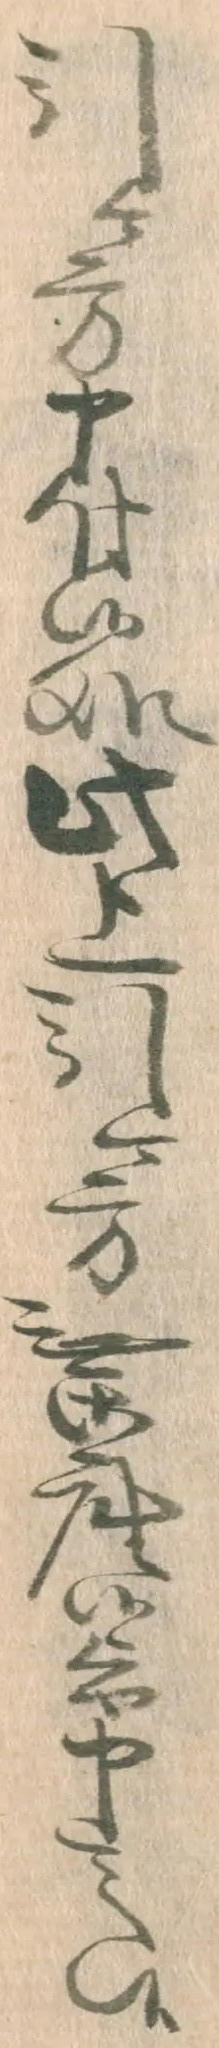引ケ方申付候処此上引ケ方無御座候旨申立候
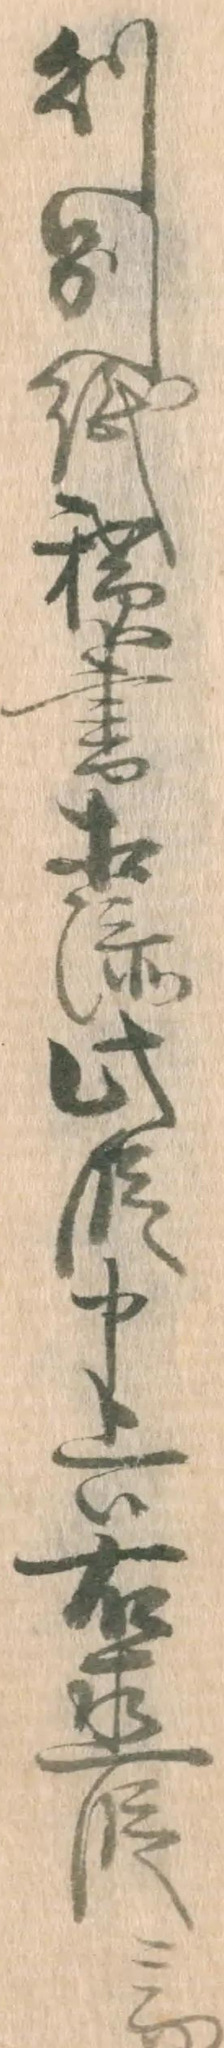則別紙積書相添此段申上候右直段ニて
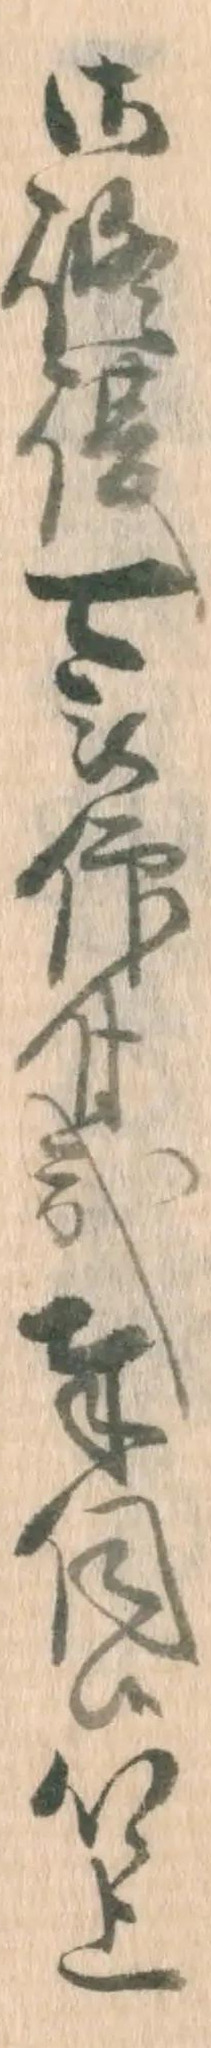御修復可被仰付哉奉伺候以上
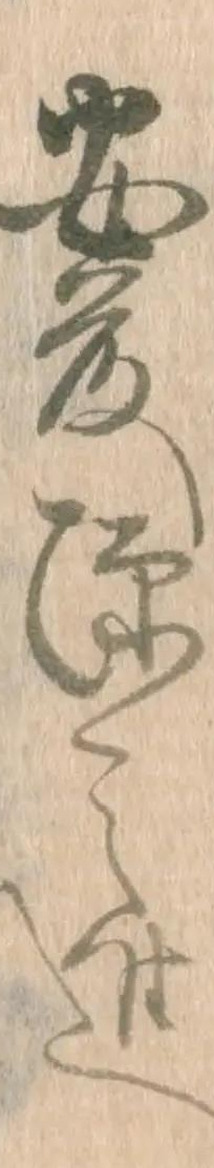安藤源之進
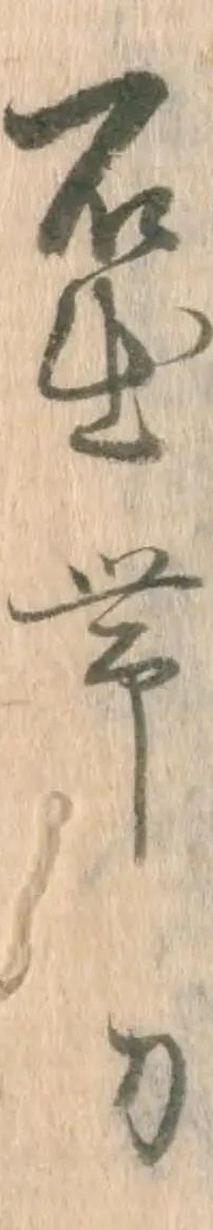石出帯刀
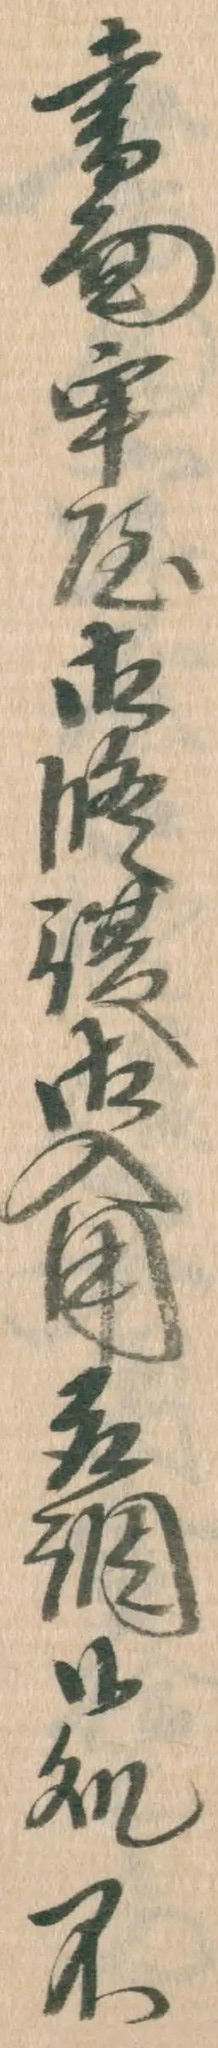書面牢屋御修復御入用取調候処不
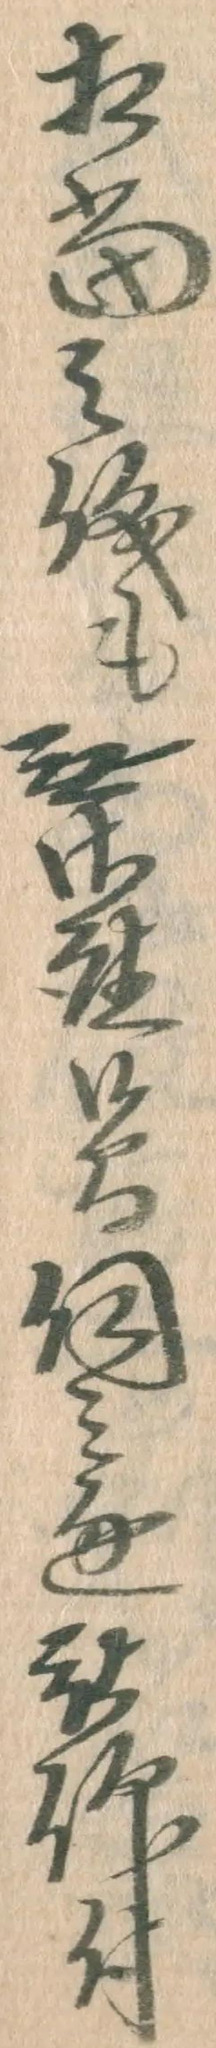相当之儀も無御座候間伺之通被仰付
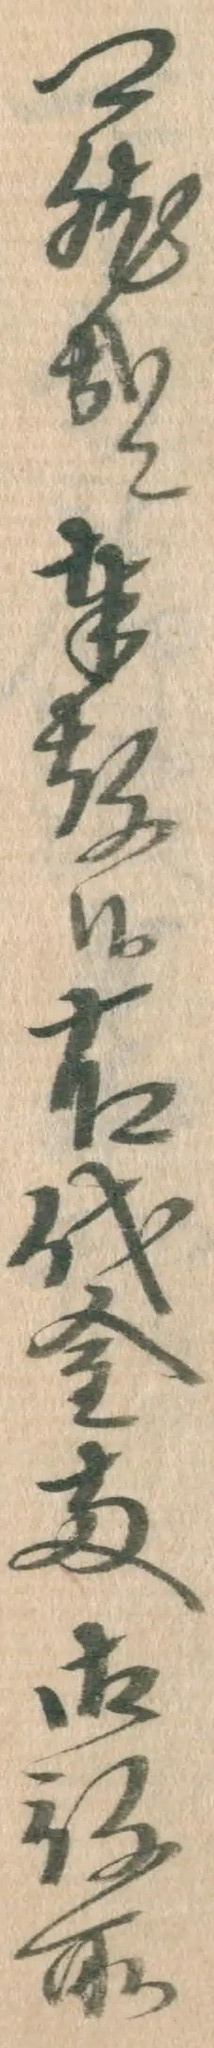可然哉ニ奉存候右代金両御役所
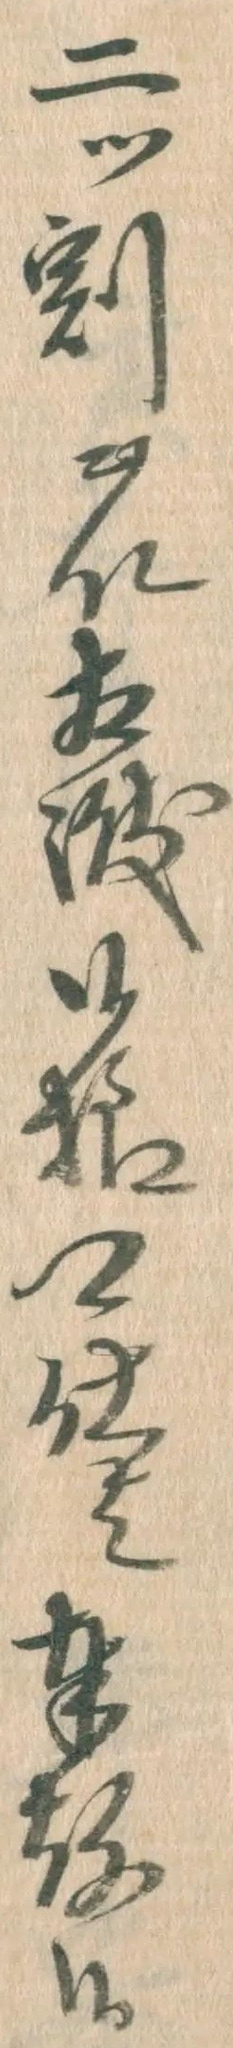二ツ割ヲ以相渡候様可仕と奉存候
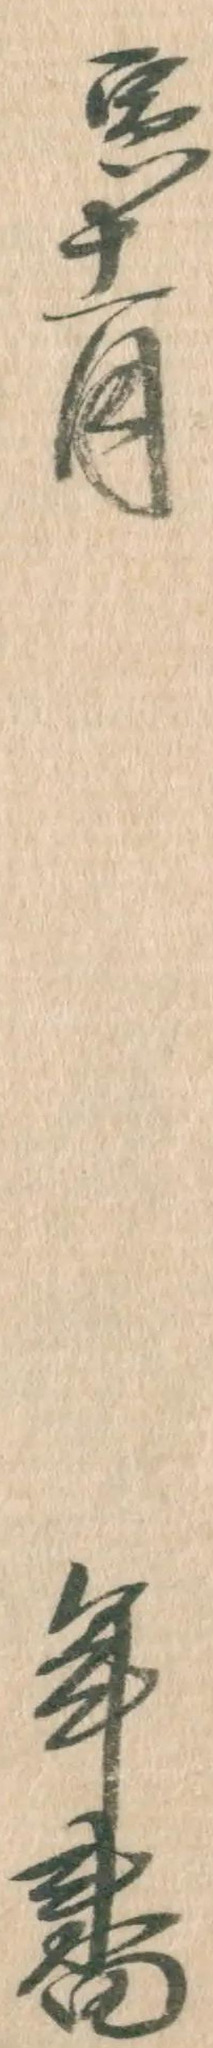寅十一月年番

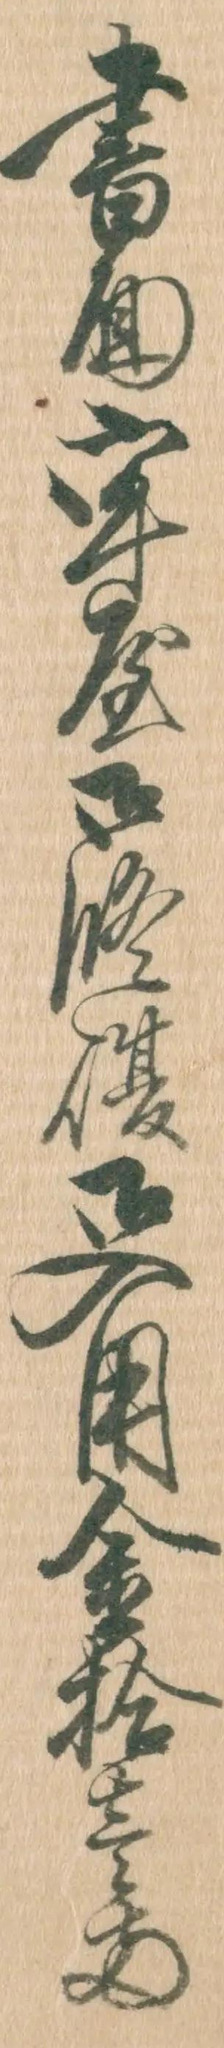書面牢屋御修復御入用金拾壱両
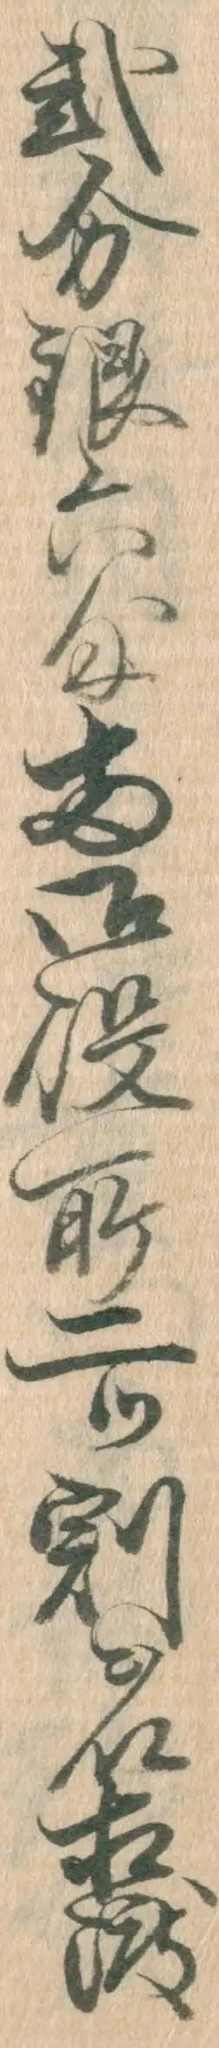弐分銀六匁両御役所二ツ割ヲ以相渡
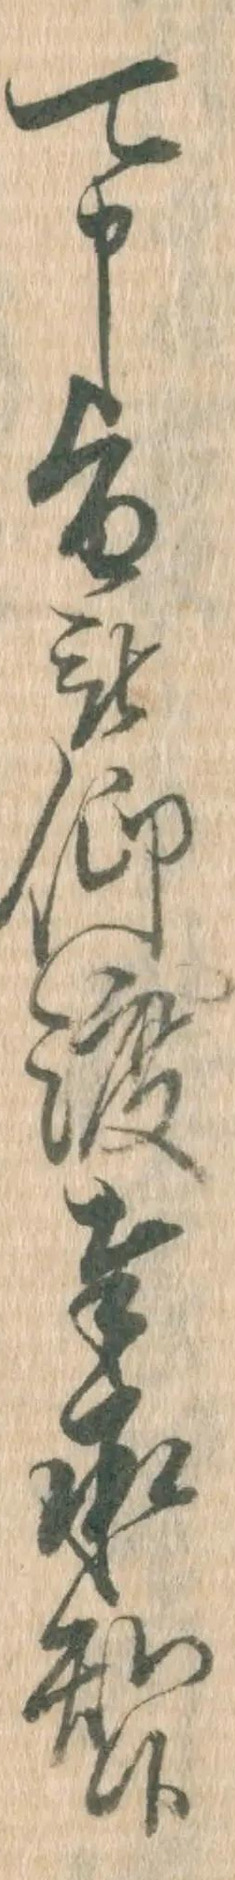可申旨被仰渡奉承知候
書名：七十冊物類集 71巻. [44] 四十三 牢屋敷御普請御修覆地震ニ付骨折候牢屋掛御褒美之部
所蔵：国立国会図書館 National Diet Library, JAPAN
